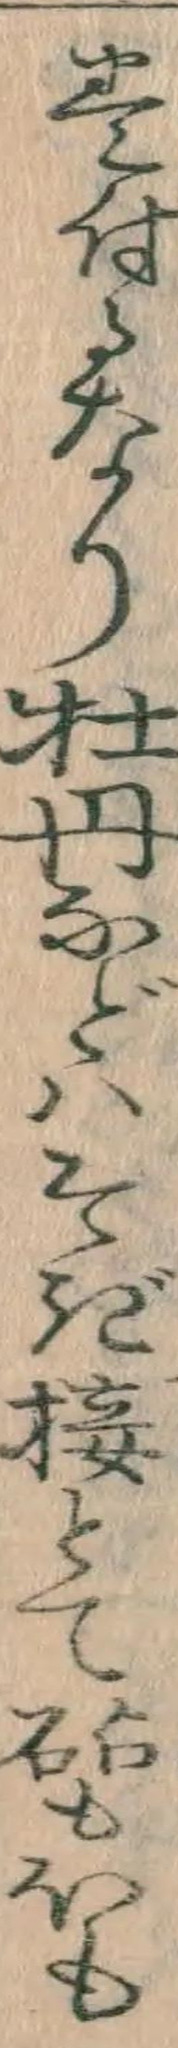巻付るなり牡丹などはそぎ接とて砧もほも
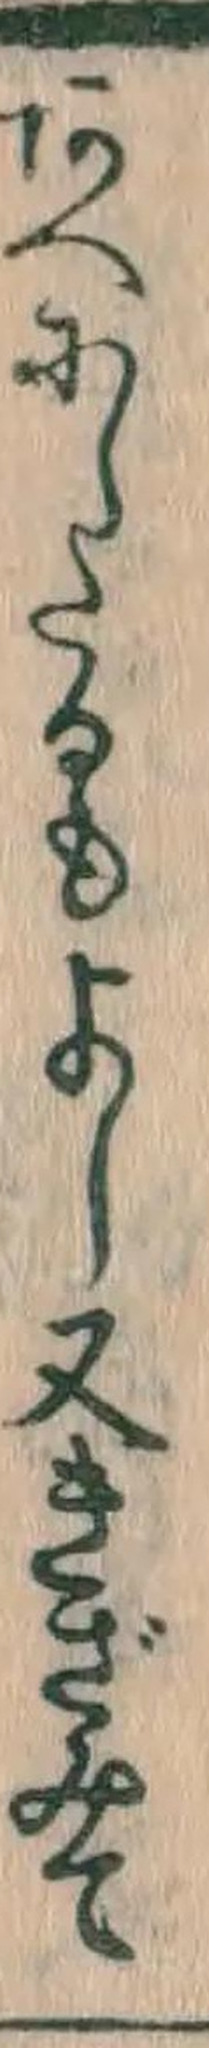あへにしたるもよし又きざみて
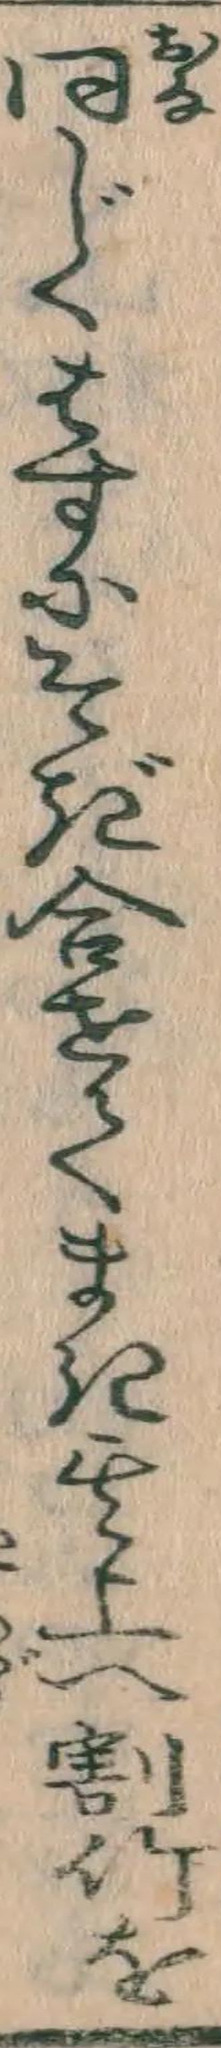同じくはすにそぎ合せてまき其上へ割竹を
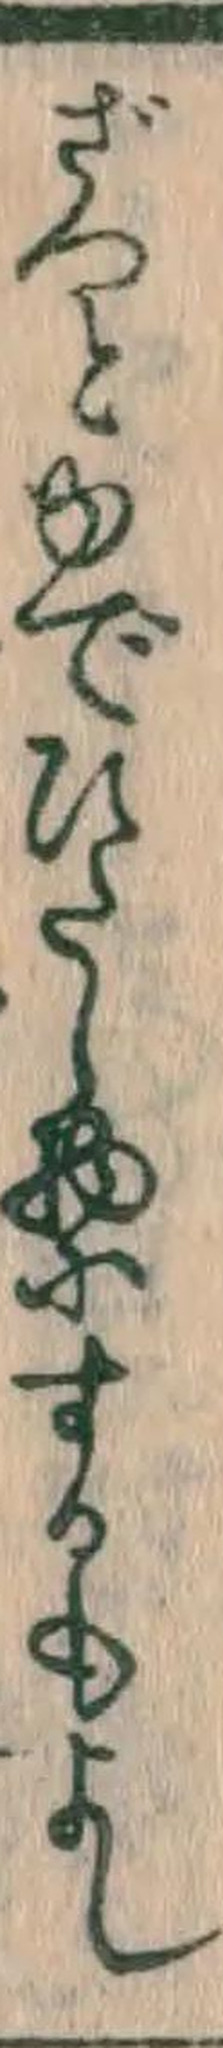ざつとゆでひたし物にするもよし
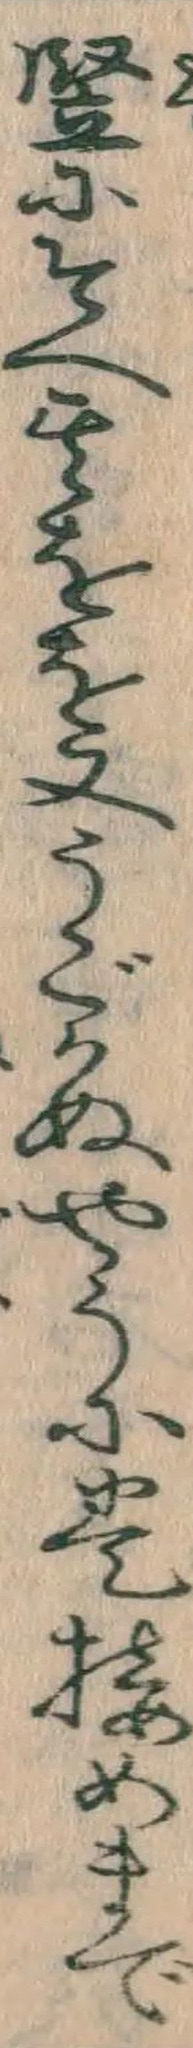竪にそへ其をを又うごかぬやうに巻接めまで
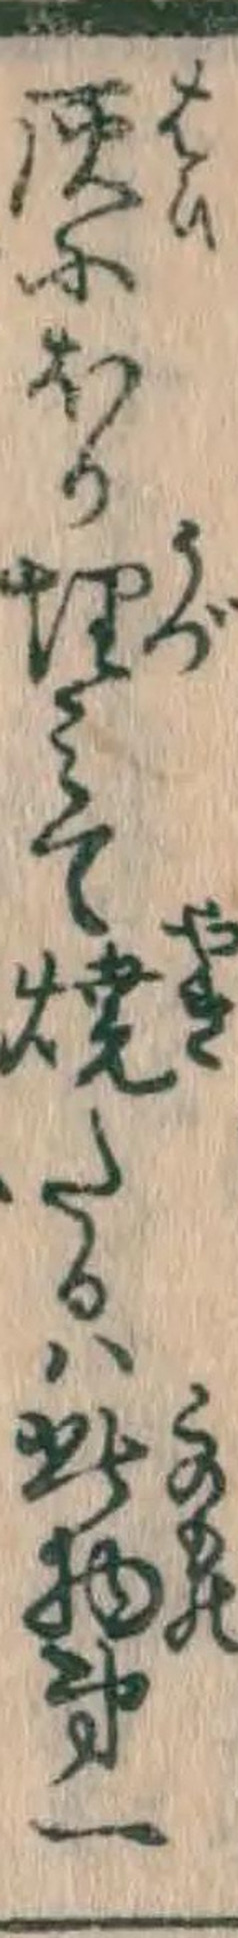灰にほり埋みて焼たるは此物第一
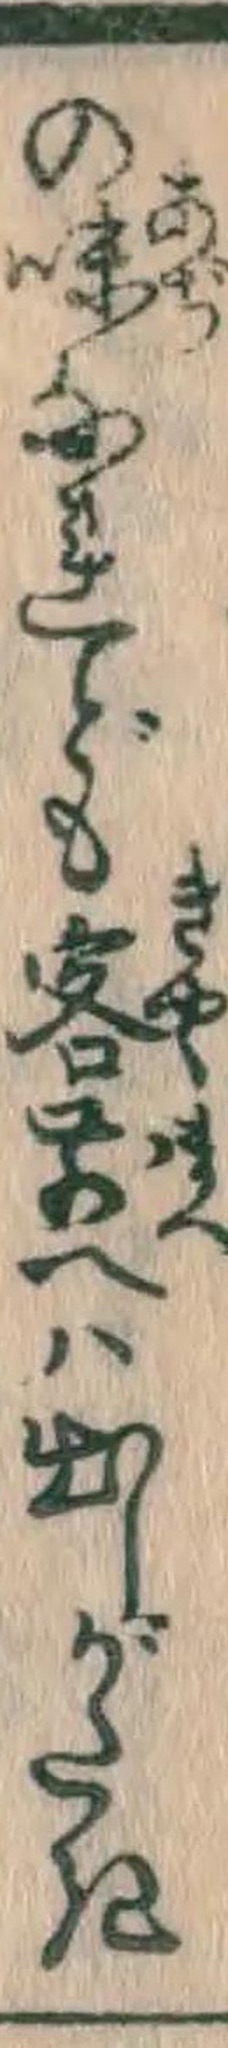の味なれども客前へは出しがたき
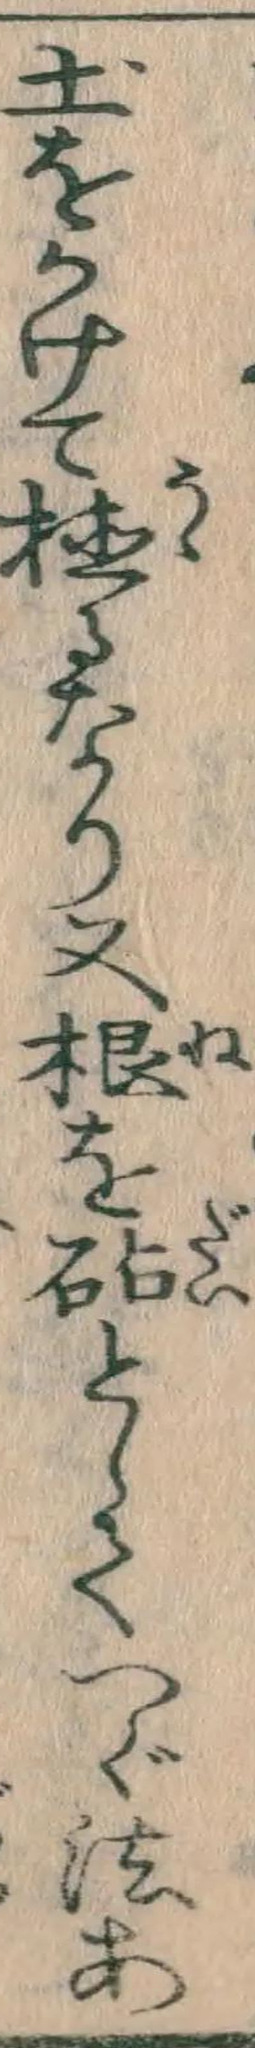土をかけて植るなり又根を砧としてつぐ法あ
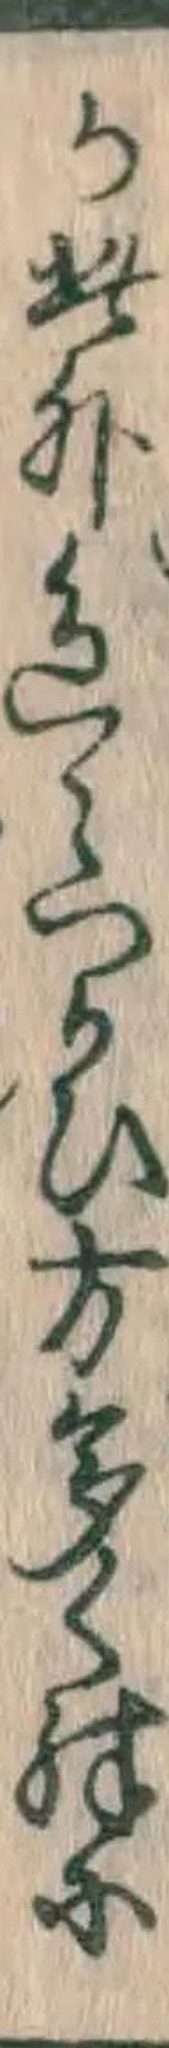か此外色々つかひ方多く殊に
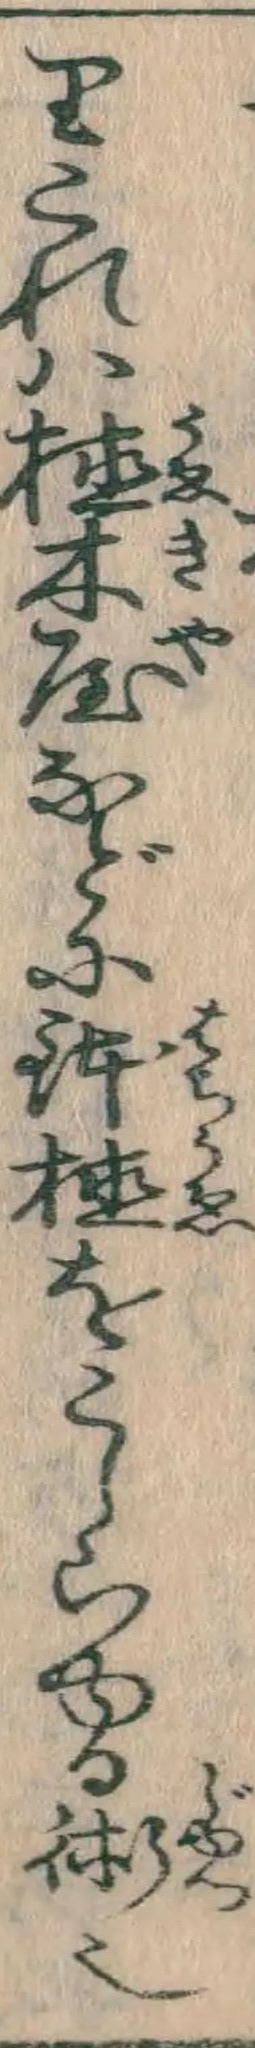りこれは植木屋などに鉢植をこしらゆる術也
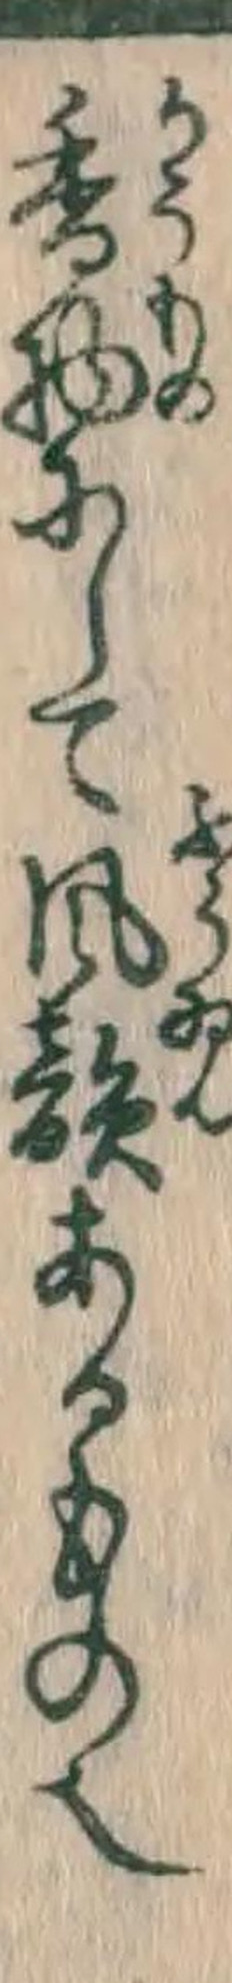香物にして風韻あるもの也
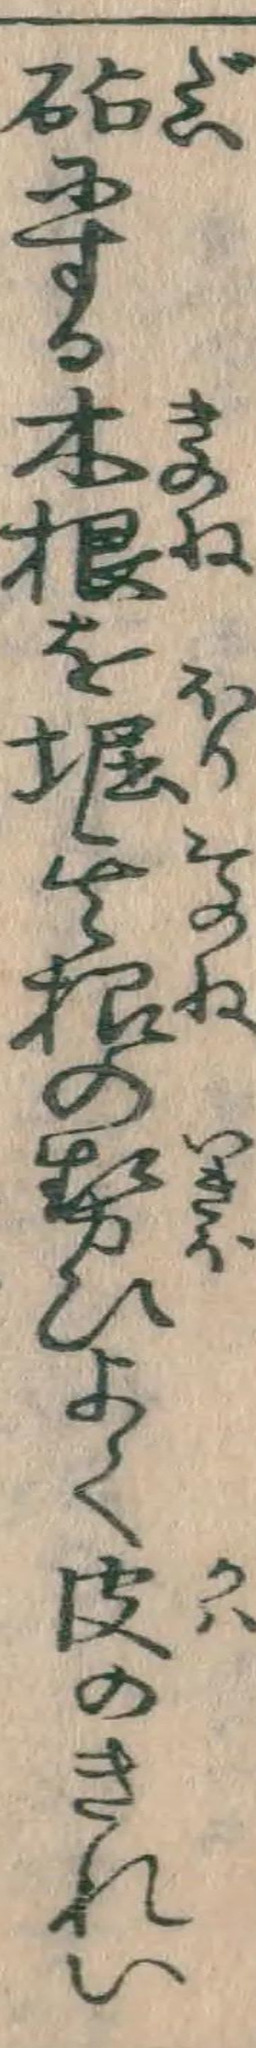砧にする木根を掘其根の勢ひよく皮のきれい
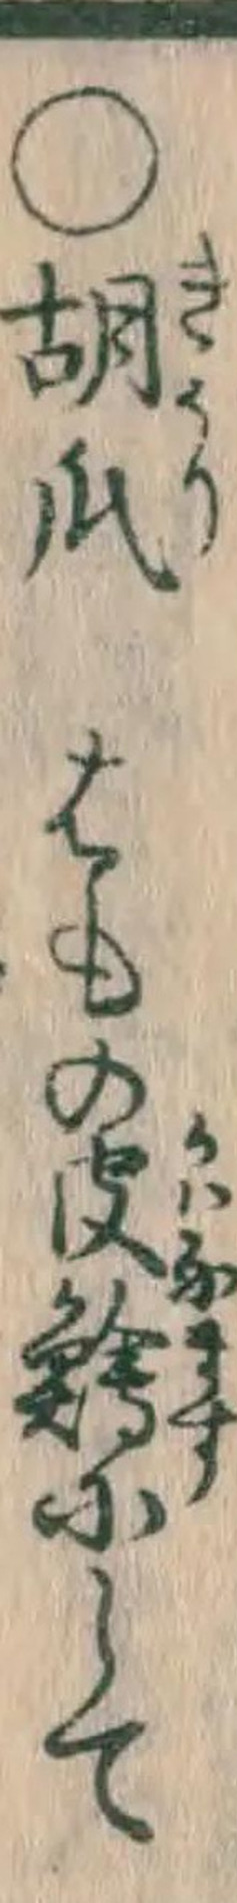○胡瓜はもの皮鱠にして
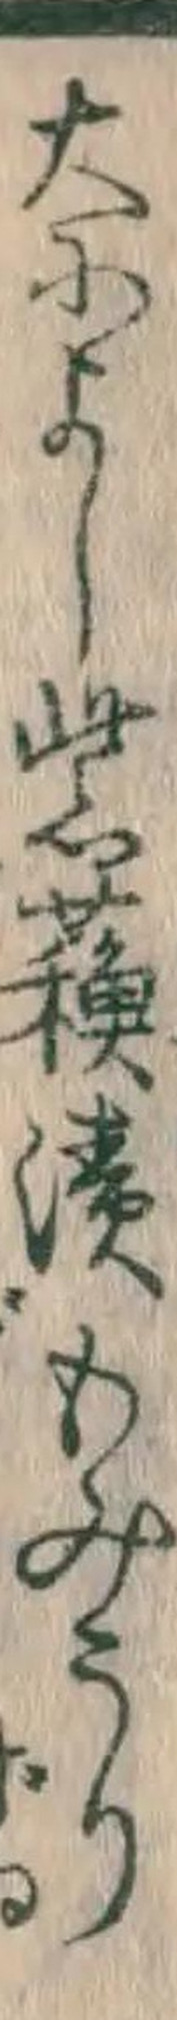大によし紫蘇漬もみうり
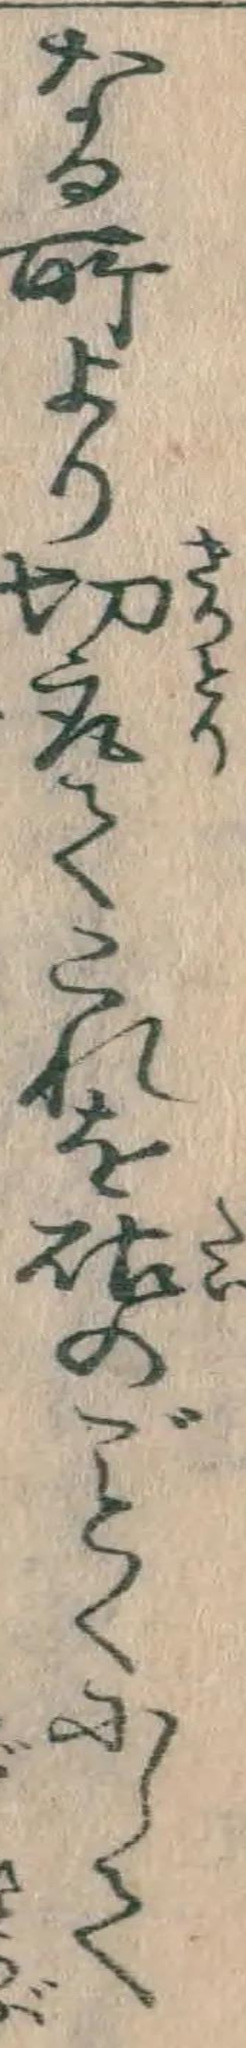なる所より切取てこれを砧のごとくにして
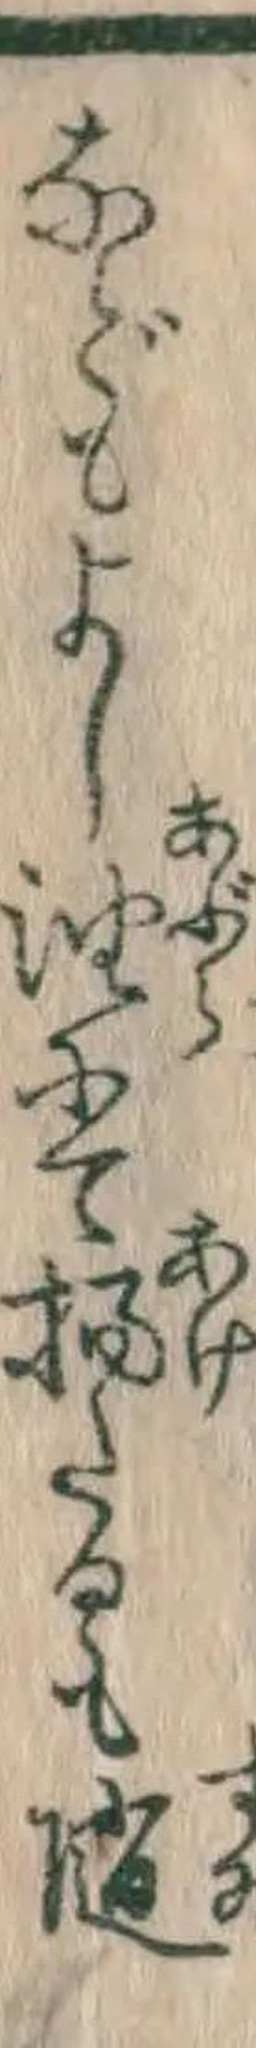などもよし油にて揚たるも随
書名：広益秘事大全 3巻. [5]
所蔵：国立国会図書館 National Diet Library, JAPAN
